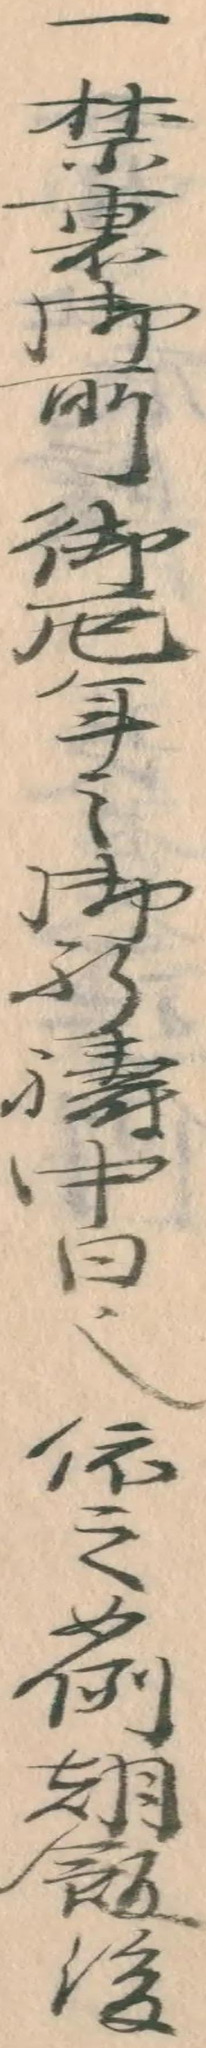一禁裏御所御厄年之御祈祷中日也依之如例朝飯後
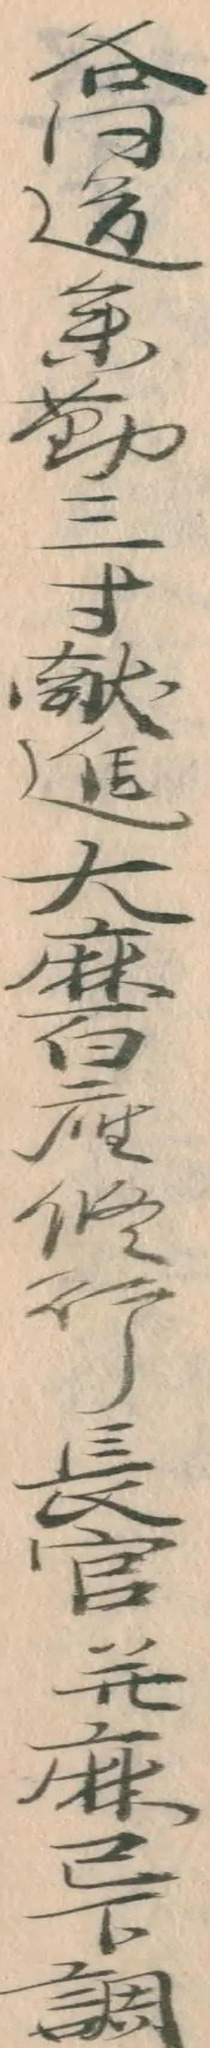各同道参勤三寸献進大麻百座修行長官并麻已下調
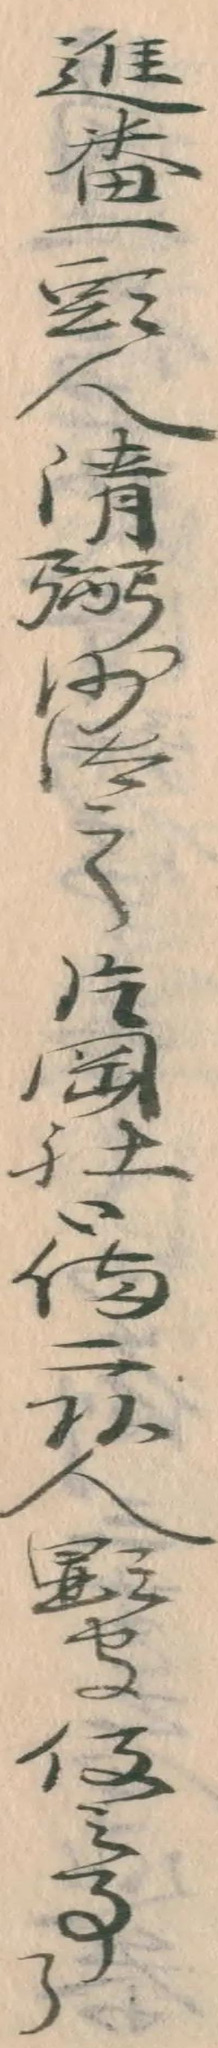進番一頭人清弼沙汰之片岡社御備二頭人顕守役之事了
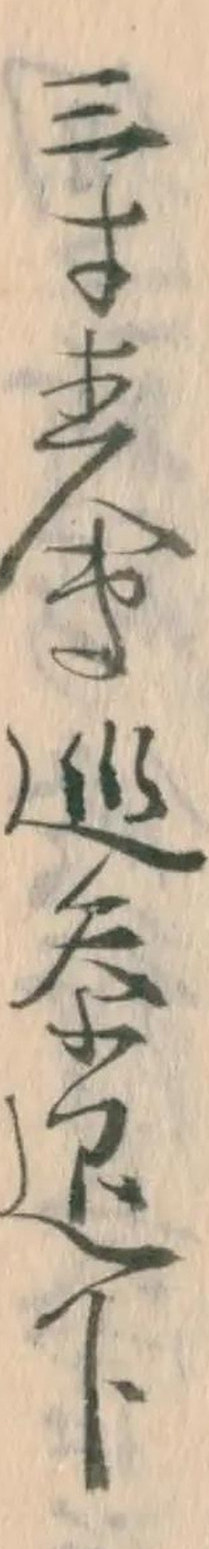三寸直會巡参退下
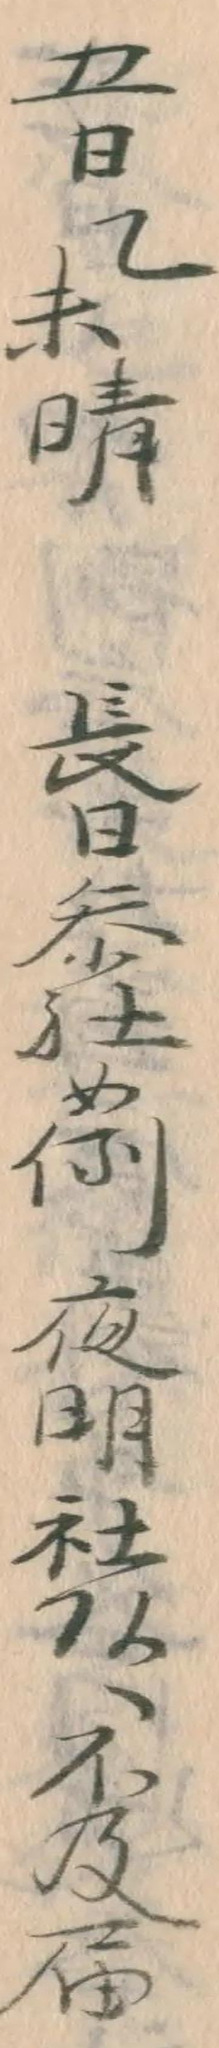五日乙未晴長日参社如例夜明社頭へ不及届
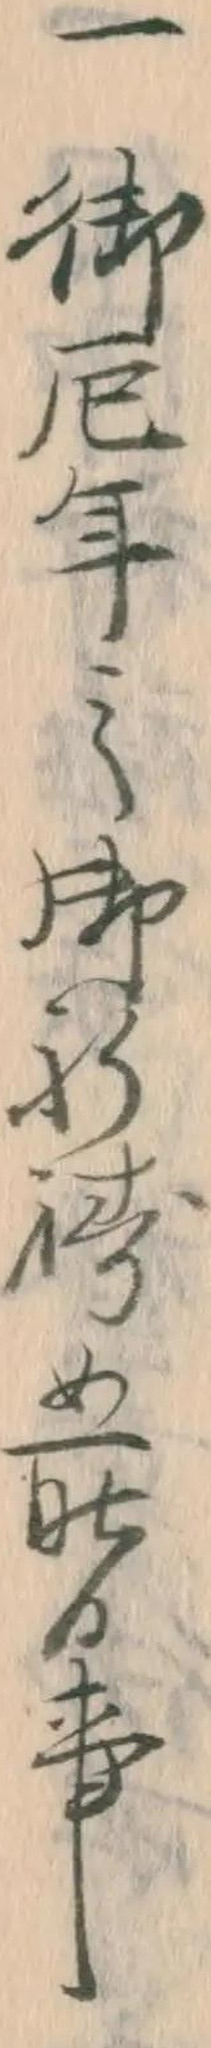一御厄年之御祈祷如昨日事
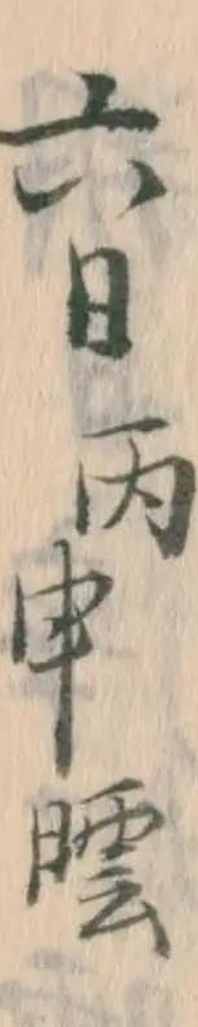六日丙申曇
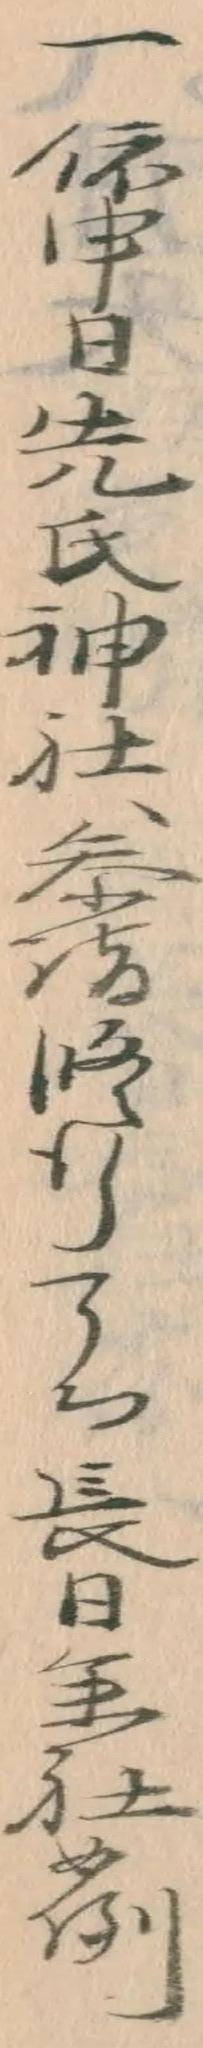一依申日先氏神社へ参詣修行了而長日参社如例
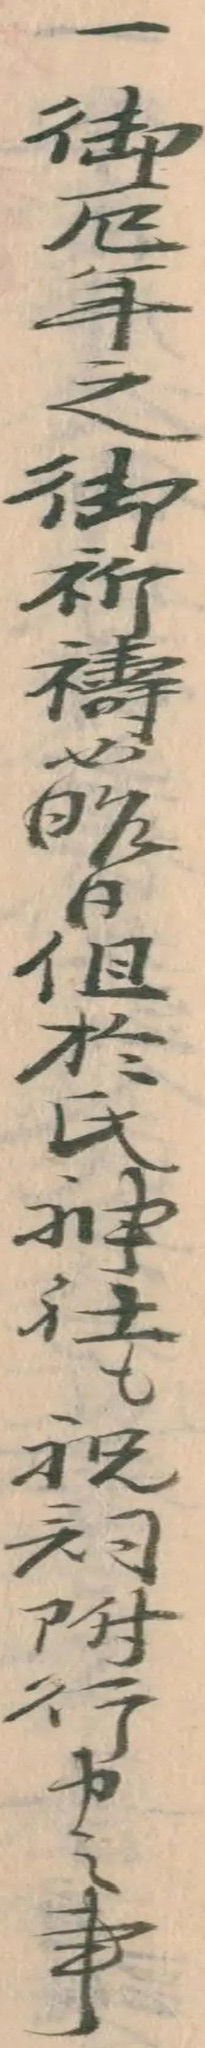一御厄年之御祈祷如昨日但於氏神社も祝詞附行申之事
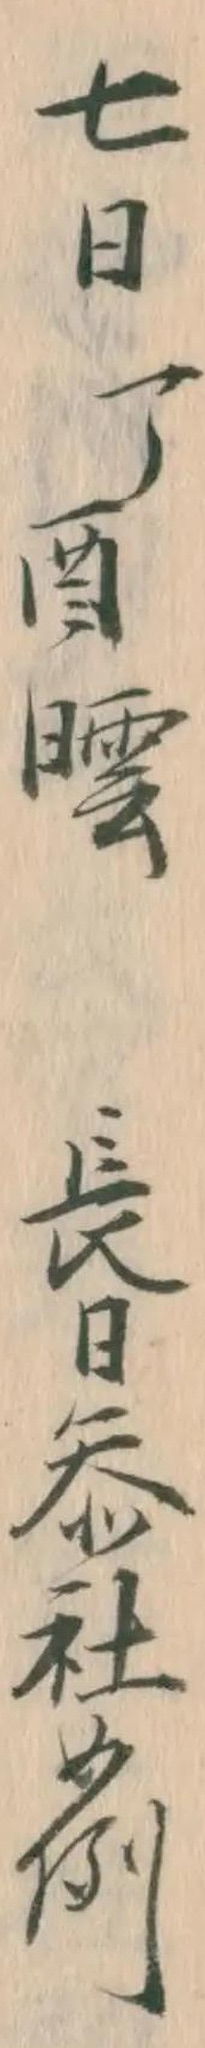七日丁酉曇長日参社如例
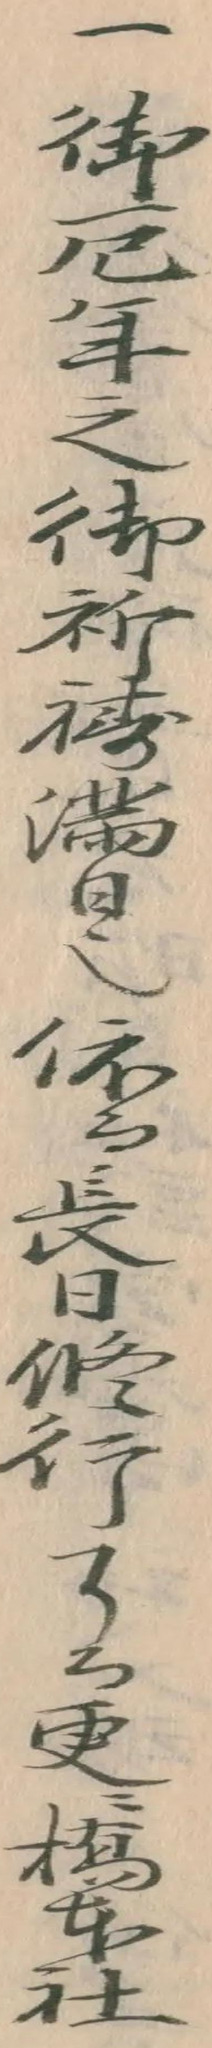一御厄年之御祈祷満日也依而長日修行了而更ニ橋本社
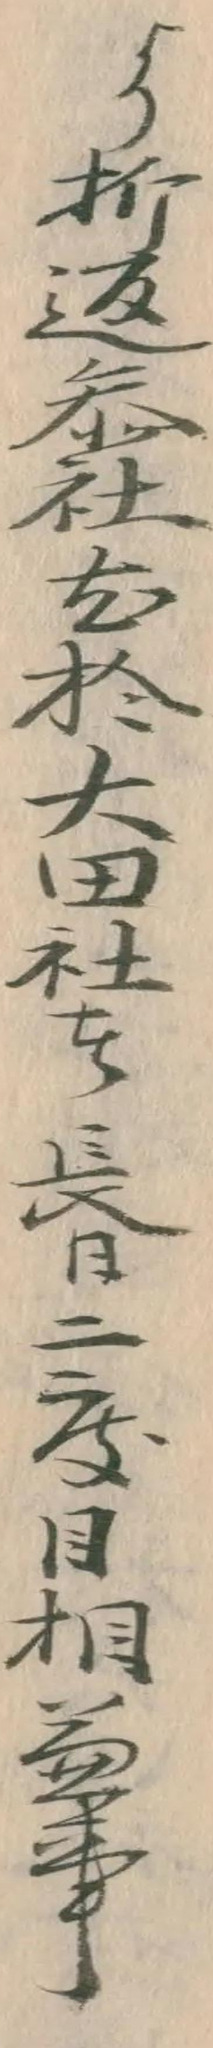より折返参社尤於大田社は長日二度目相兼事
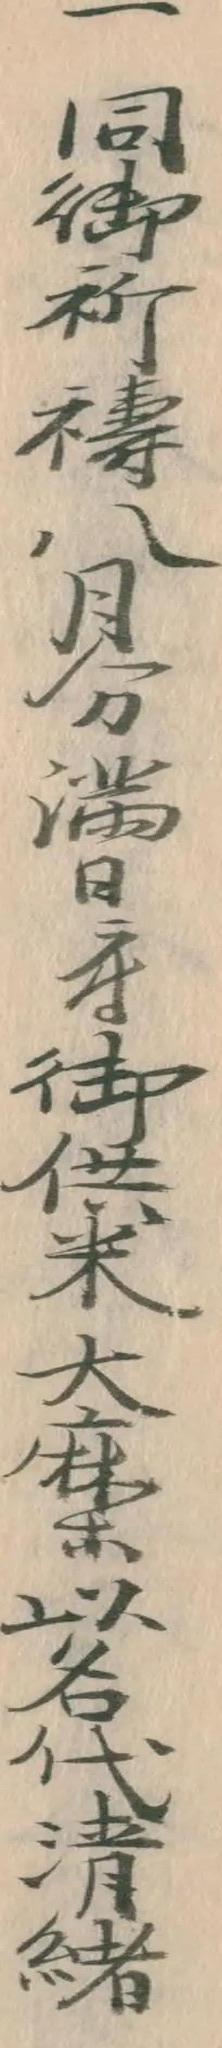一同御祈祷八月分満日ニ付御供米大麻等以名代清緒
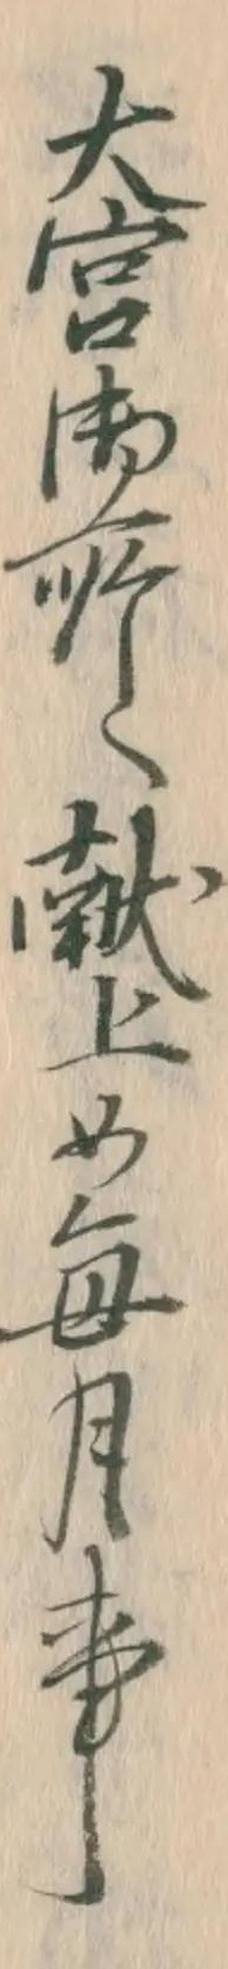大宮御所へ献上如毎月事
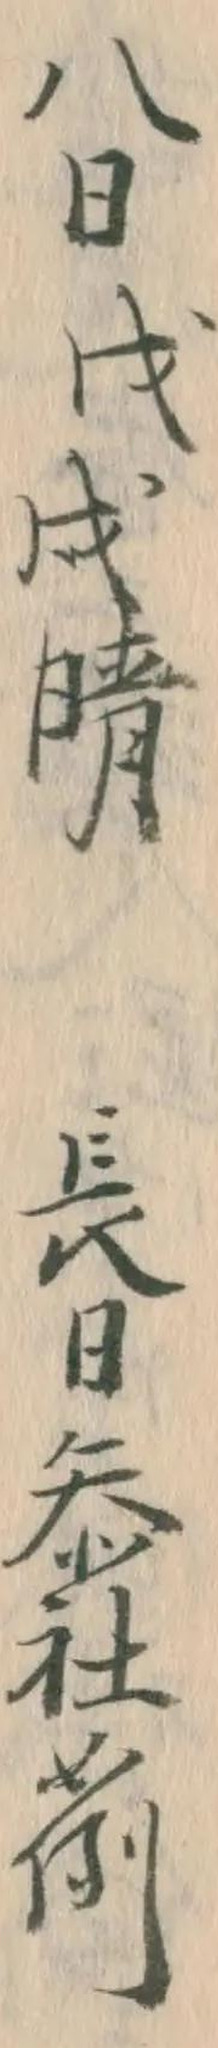八日戊戌晴長日参社如例
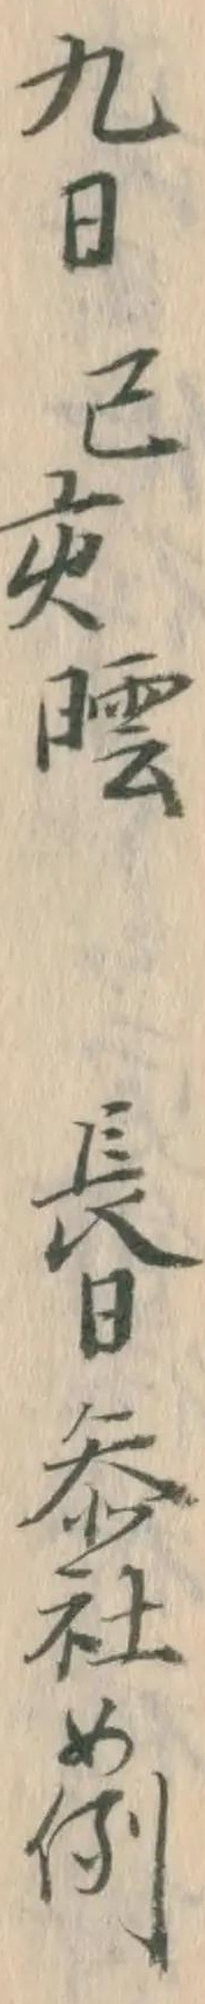九日己亥曇長日参社如例
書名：賀茂社記録. 第73冊
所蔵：国立国会図書館 National Diet Library, JAPAN
